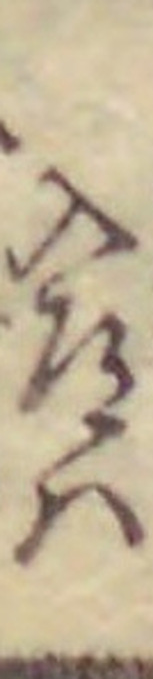入道は
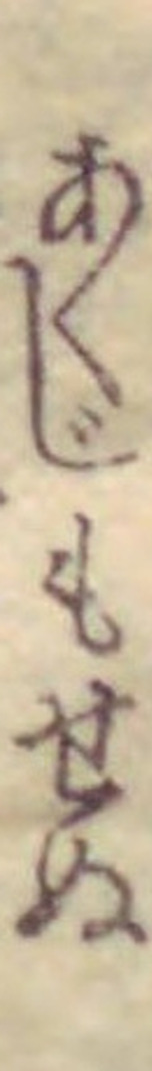あくじもせぬ
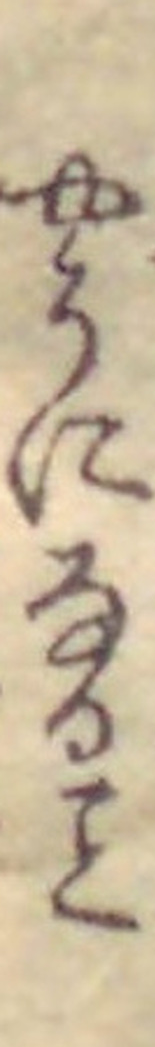やうになること
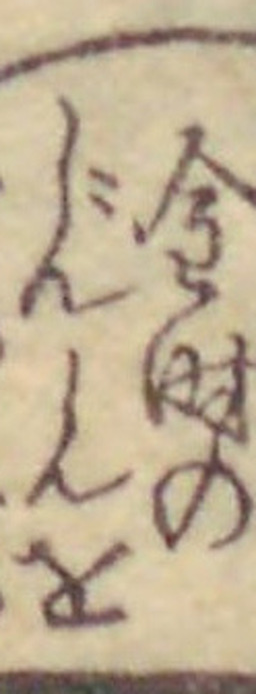じんしんを
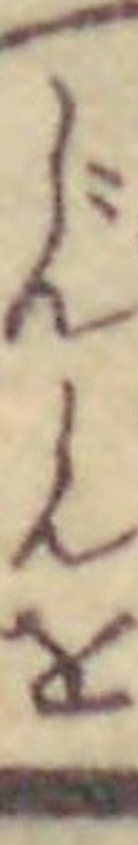じんしんを
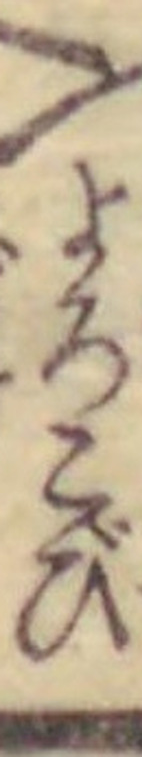よろこび
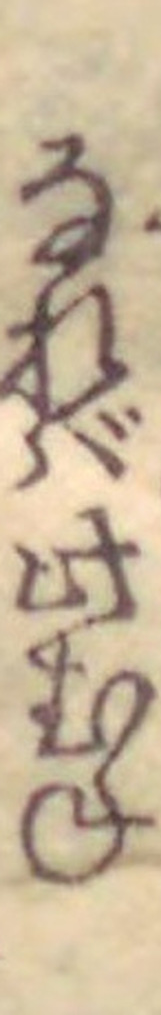なれば此むね
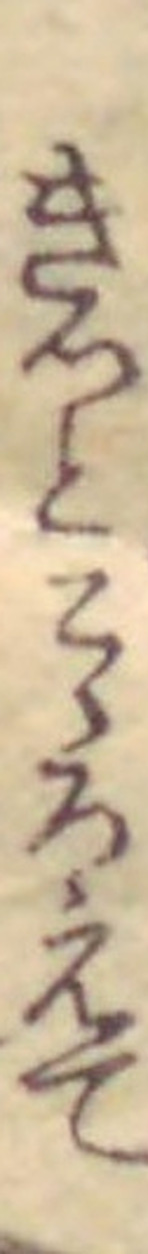きつとこゝろえて
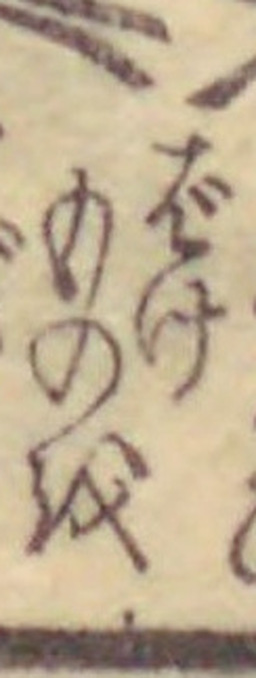ものを
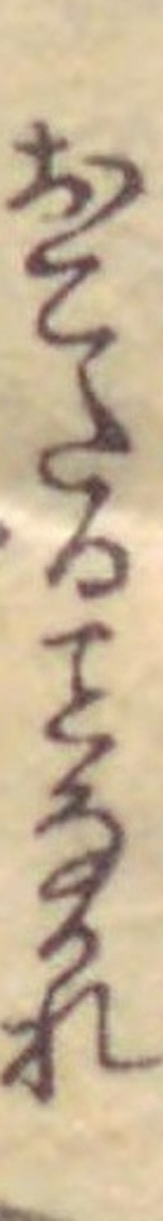おこたることなかれ
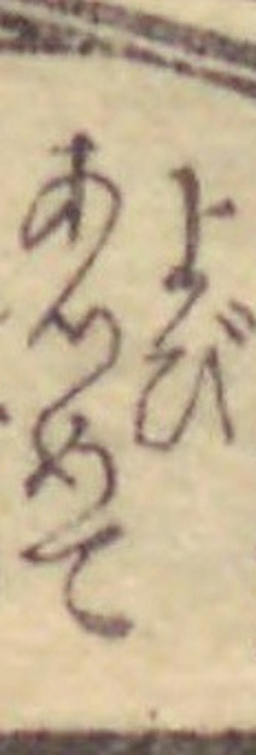あつめて
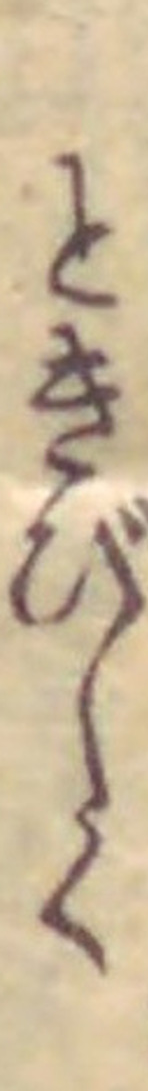ときびしく
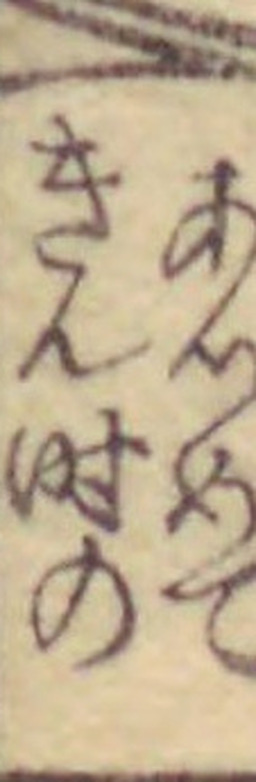きん時の
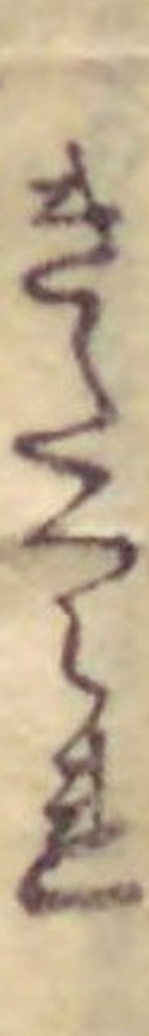きたへられ
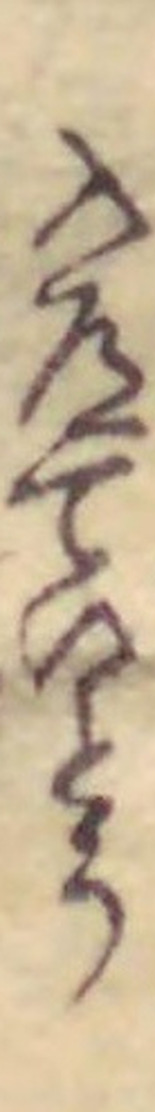入道ていとう
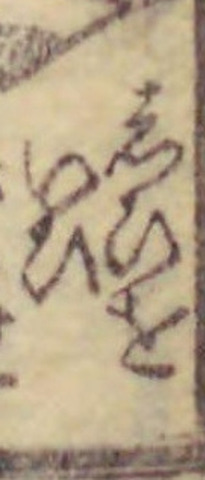しひを
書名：化物世帯氣質
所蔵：国立国会図書館 National Diet Library, JAPAN
